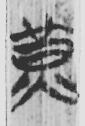黃
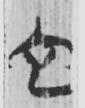它
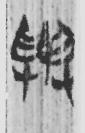與
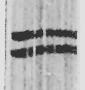二
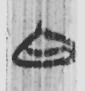白
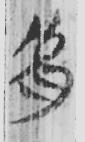兔
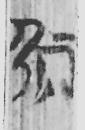凥
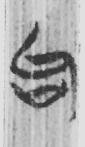句
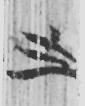之
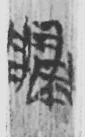{爿帚}（寢）
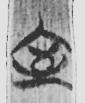室
